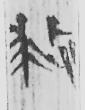救
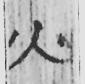火
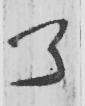乃
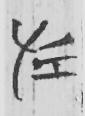左
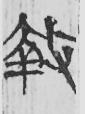{幸攴}
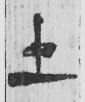土
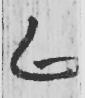㠯（以）
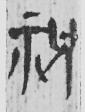祝
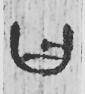曰
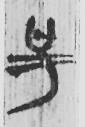号
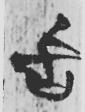旨
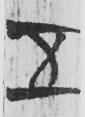五
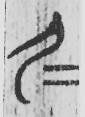𡰥
